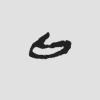㠯（以）
